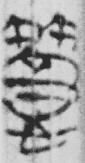○（篤）
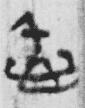○（仁）
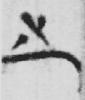之
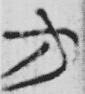方
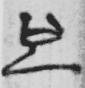也
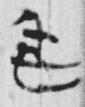○（仁）
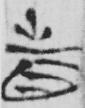眚（性）
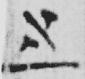之
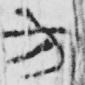方
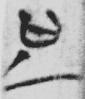也
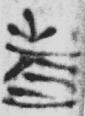眚（性）
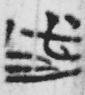或
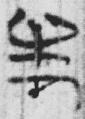生
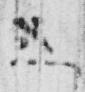之
